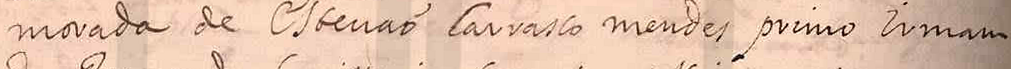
morada de Esteuaõ Carrasco mendes primo irmam
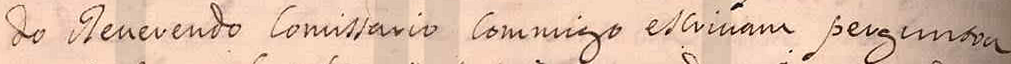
do Reuerendo Comissario Commigo escriuam perguntou
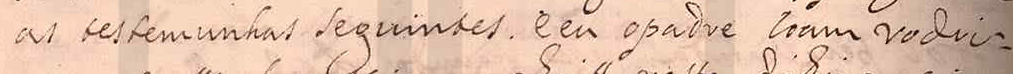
as testemunhas seguintes. E eu o padre Ioam rodri
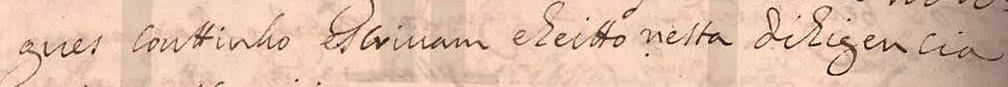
gues couttinho escriuam eleitto nesta diligencia
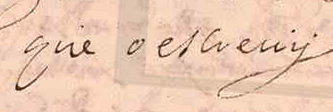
que o escreuy
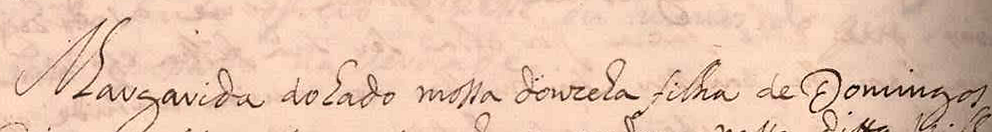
Margarida do Lado mossa donzela filha de Domingos
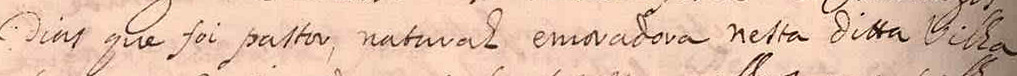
dias que foi pastor, natural e moradora nesta ditta Villa
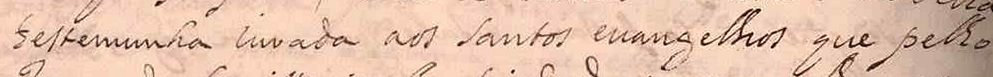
testemunha iurada aos Santos euangelhos que pello
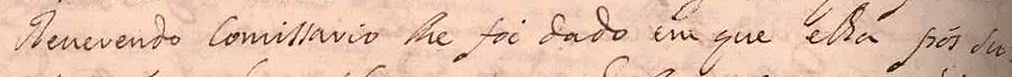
Reuerendo Comissario lhe foi dado em que ella pós su
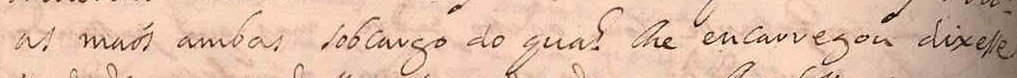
as maõs ambas sob cargo do qual lhe encarregou dixesse
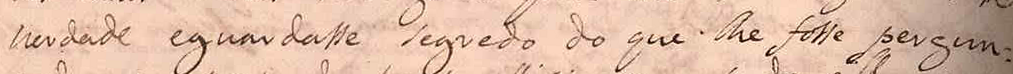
uerdade e guardasse segredo do que lhe fosse pergun
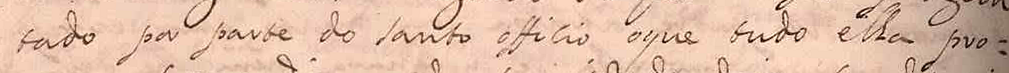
tado por parte do santo officio o que tudo ella pro
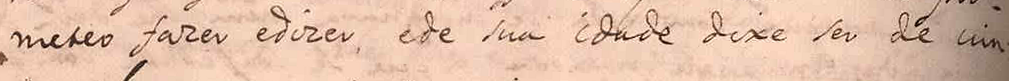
meteo fazer e dizer e de sua idade dixe ser de uin
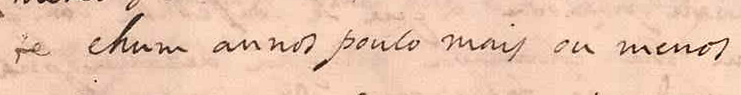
te e hum annos pouco mais ou menos
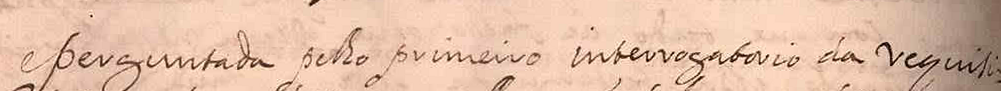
e perguntada pello primeiro interrogatorio da requisi
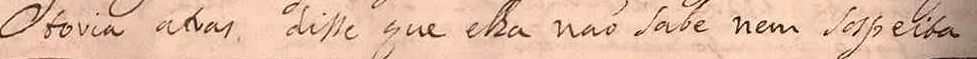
toria atras disse que ella naõ sabe nem sospeita
